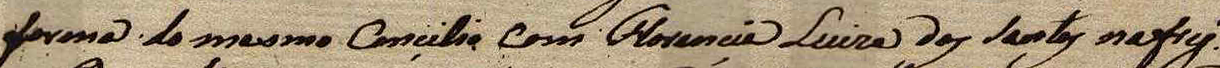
forma do mesmo Conçilio com Florençia Luiza dos Santos na freg.a
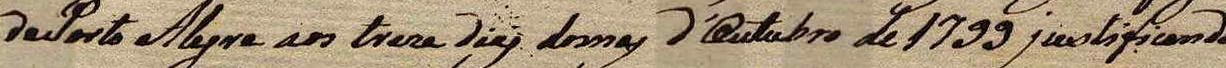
de Porto Alegre aos treze dias do mes d'Outubro de 1799 justificando
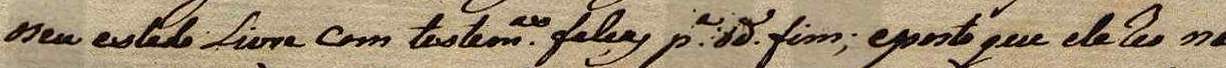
o seu estado Livre com testem.as falças p.a o d.o fim; e posto que ele Reo na
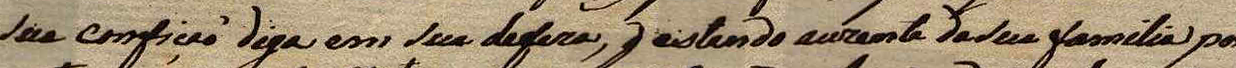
sua confiçaõ diga em sua defeza, q̄ estando auzente da sua familia por
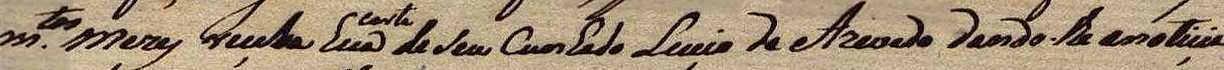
m.tos mezes reçeba huā carta de seu Cunhado Luçio de Azevedo dando-lhe a notiçia
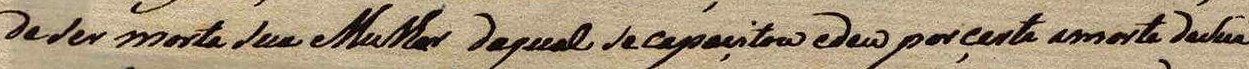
de ser morta sua Mulher da qual se capaçitou e deu por çerta a morte de sua
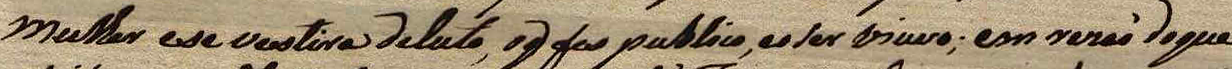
mulher e se vestira de luto, o q̄ fes publico, ao ser viuvo; em rezaõ do que
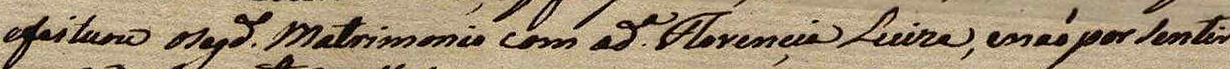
efeituou o segd.o Matrimonio com a d.a Florençia Luiza, e naõ por sentir
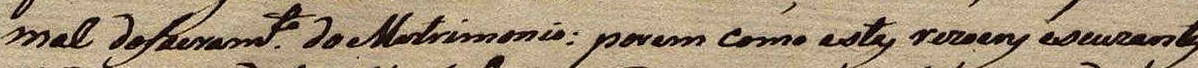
mal do Sacram.to do Matrimonio: porem como estas rezoens escuzantes
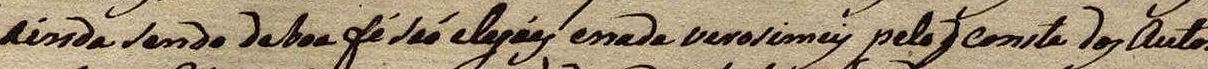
ainda sendo de boa fé saõ elegáes e nada verosimeis pelo q̄ consta dos Autos
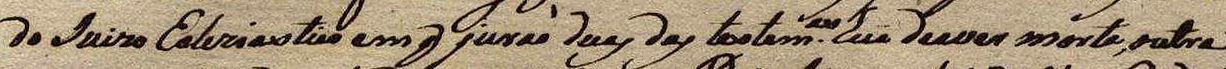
do Iuizo Ecleziastico em q̄ juraõ duas das testem.as hua de a ver morta, outra
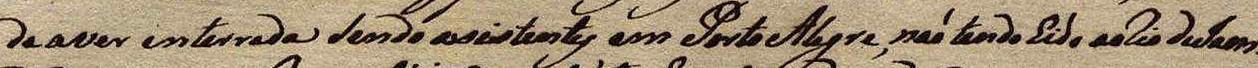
de a ver enterrada sendo asistentes em Porto Alegre, naõ tendo hido ao Rio de Ianr.o
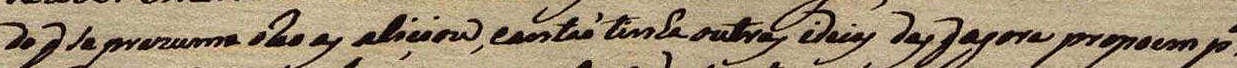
do q̄ se prezuma o Reo as aliçiou, e entaõ tinha outras ideias das q̄ agora propoem p.a
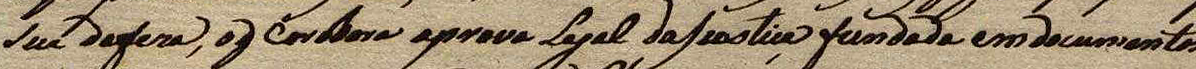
sua defeza, o q̄ corobora a prova Legal da Justiça fundada em documentos
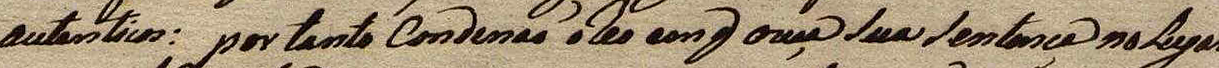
autenticos: por tanto condenaõ o Reo em q̄ ouça sua sentença no Lugar
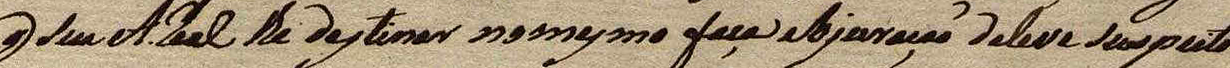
q̄ Sua A. Real lhe destinar no mesmo faça abjuraçaõ de leve suspeito
